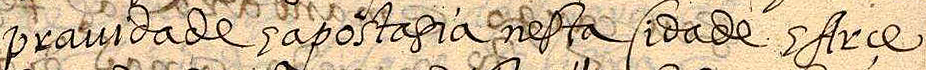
prauidade E apostasia nesta Cidade E Arçe
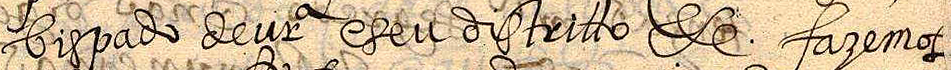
bispado deura e seu distritto &c. fazemos
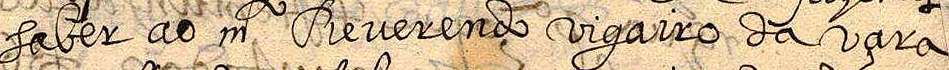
saber ao mto Reuerendo vigairo da vara
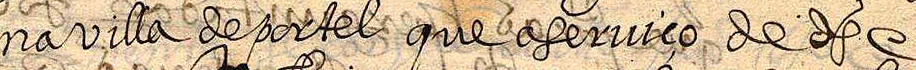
na villa de portel que a seruiço de ds̄ e
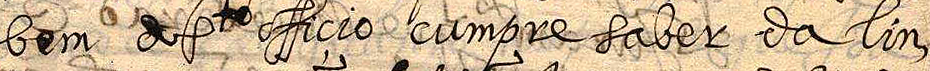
bem do sto offiçio cumpre saber da lin
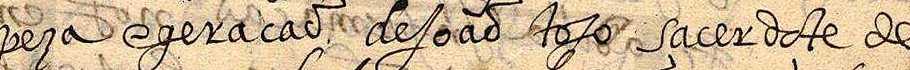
peza e geracaõ de Joaõ tojo sacerdote de
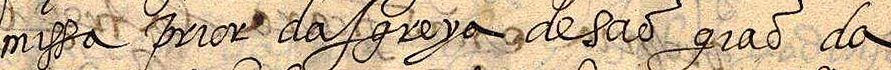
missa prior da Jgreya de saõ giaõ da
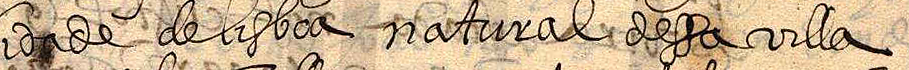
Cidade de lisboa natural dessa villa
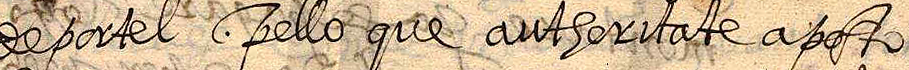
de portel. Pello que authoritate aposto
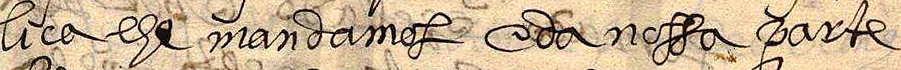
lica lhe mandamos e da nossa parte
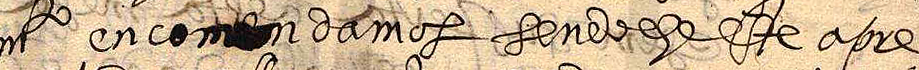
mto encomendamos sendolhe este apre
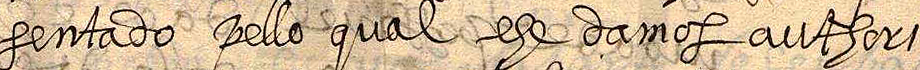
sentado pello qual lhe damos authori
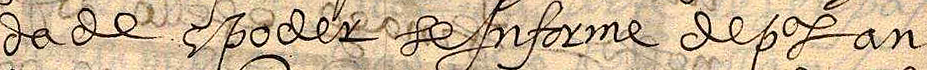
dade E poder se Jnforme de pas an
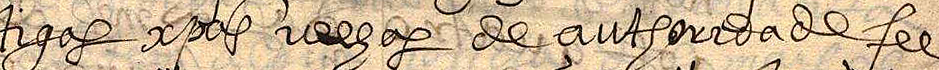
tigas xpas̄ uelhas de authoridade fee
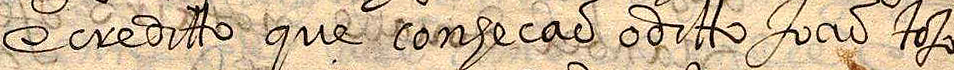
e creditto que conhecaõ o ditto Joaõ tojo
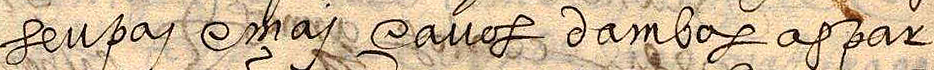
seu paj e maj e auos dambas as par
